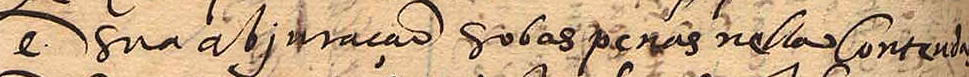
ē sua abjuraçaõ sob as penas nella Conteudas
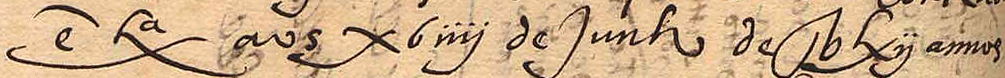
ē lxa aos xbiiij de Junho de jblxij annos
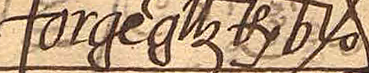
Jorge ḡllz Rybro
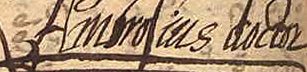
Ambrosius doctor
